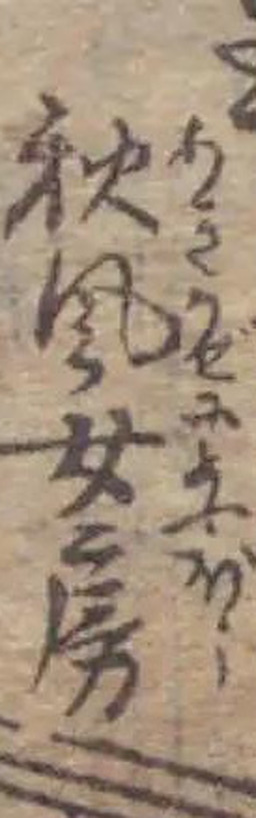秋風女房
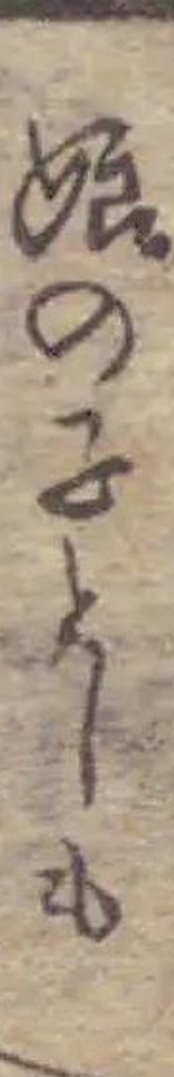娘の子としも
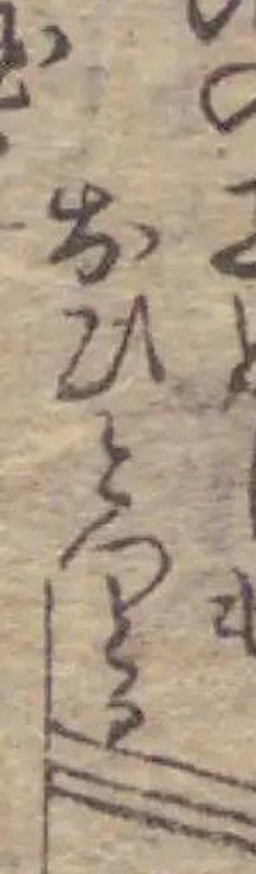おひとつとる
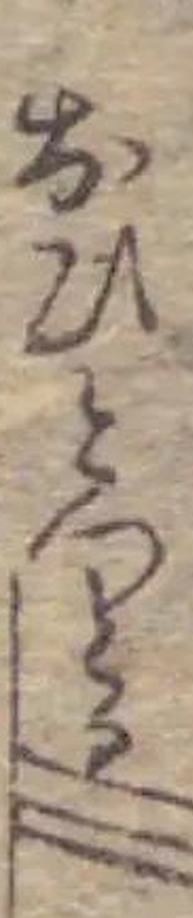おひとつとる
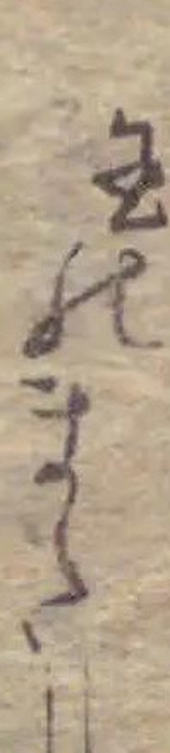玉のまた
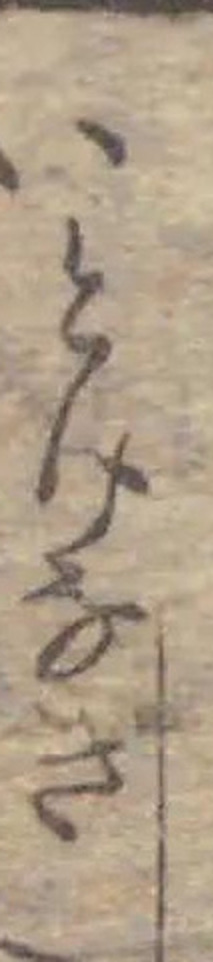いとけなき
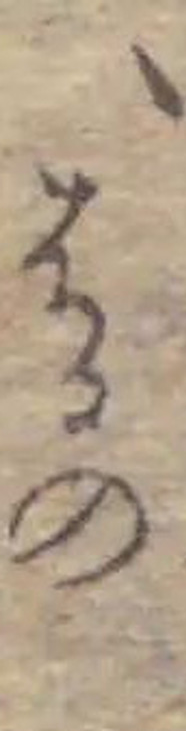はるの
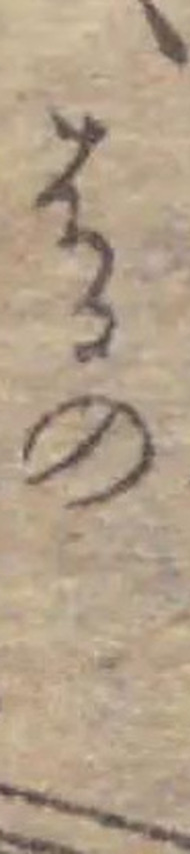はるの
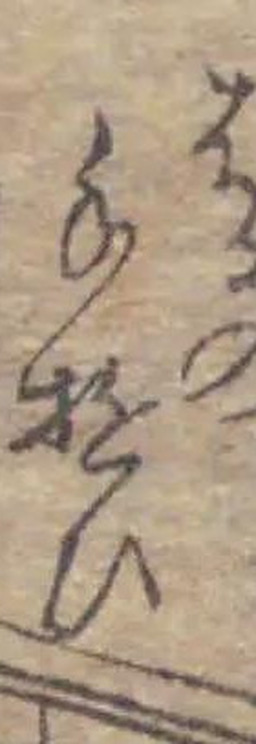手遊び

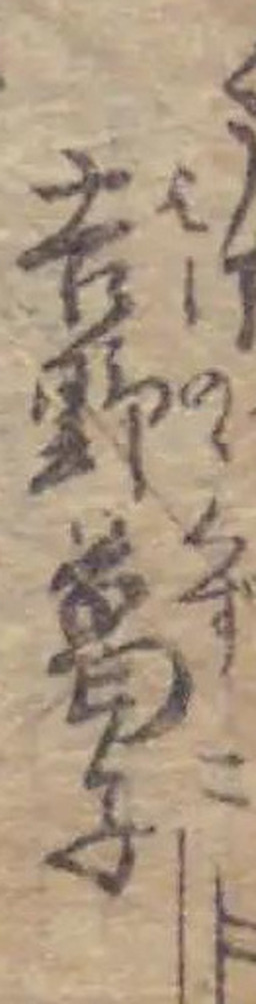吉野葛子
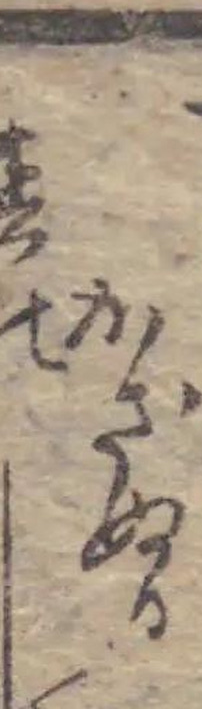かさぬる
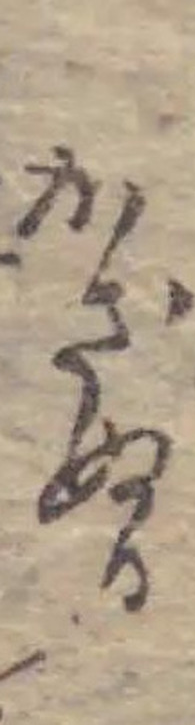かさぬる
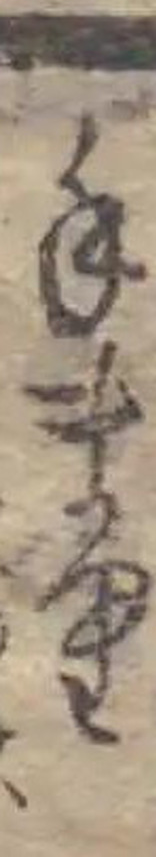手まり
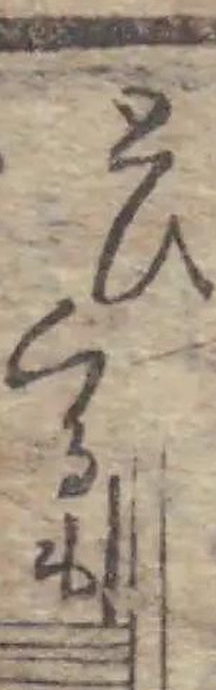とひくるも
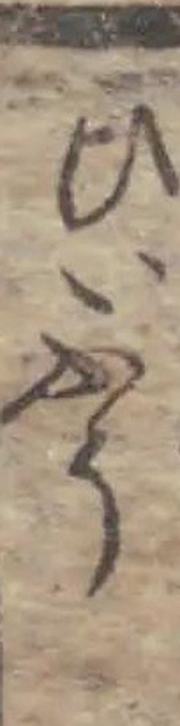ひいふう
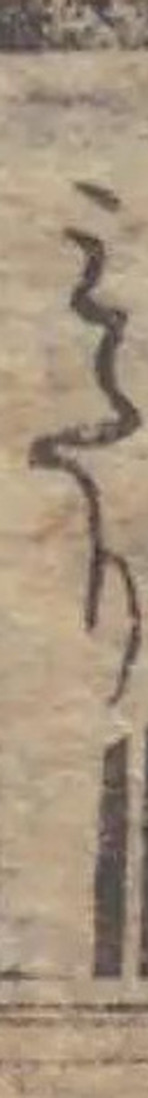みたり
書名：金平子供遊 2巻
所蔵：国立国会図書館 National Diet Library, JAPAN
